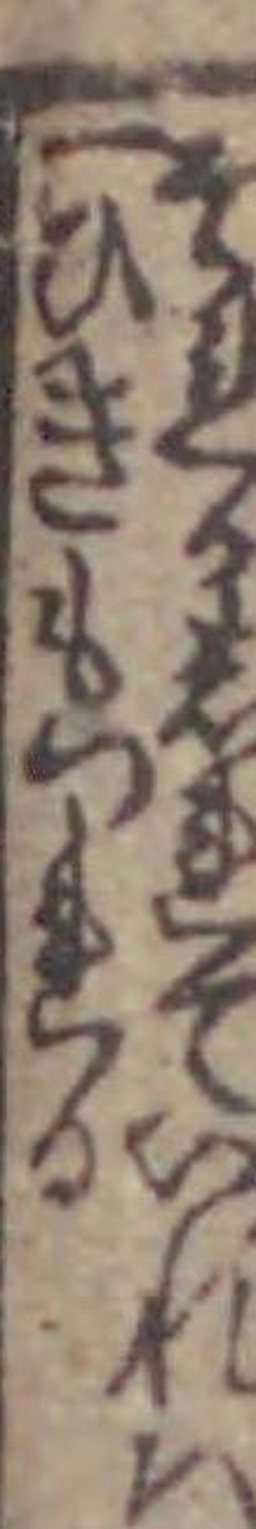一ひきもつれる
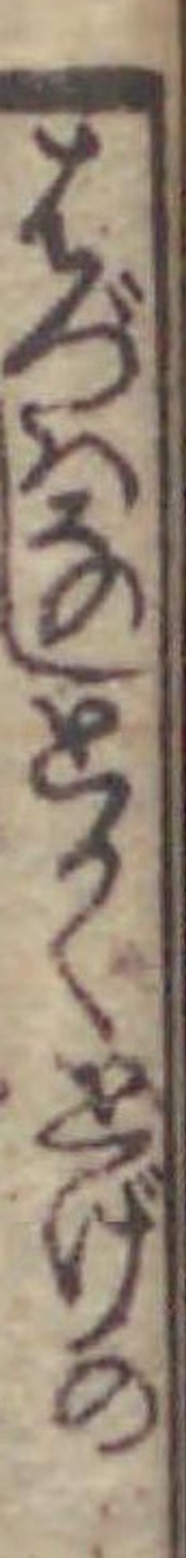はづはなしとかくとげの
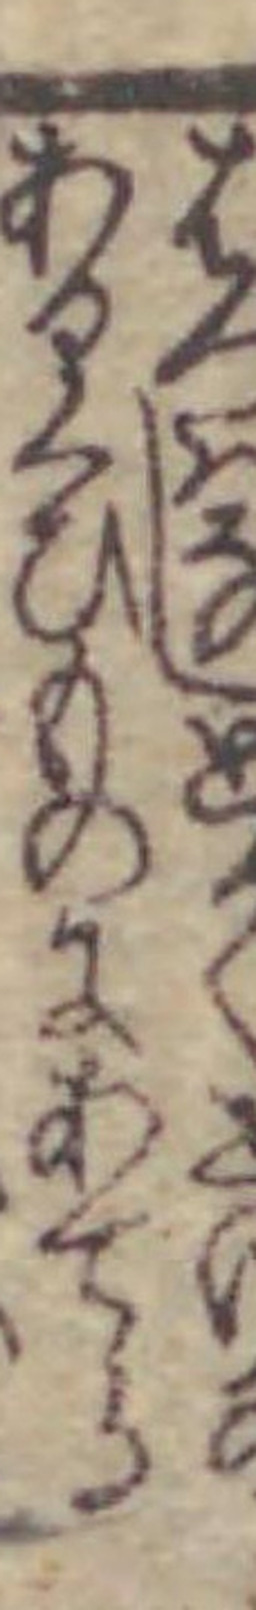あるくひものにあてら
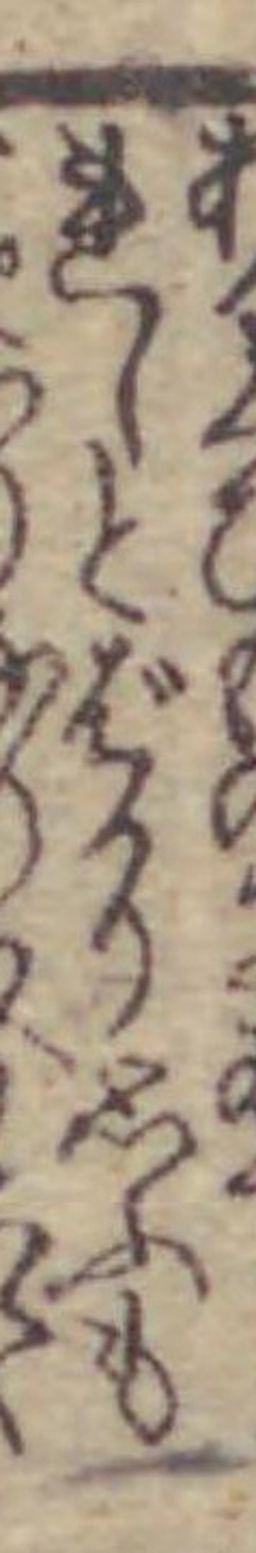れしとばかり思ふも
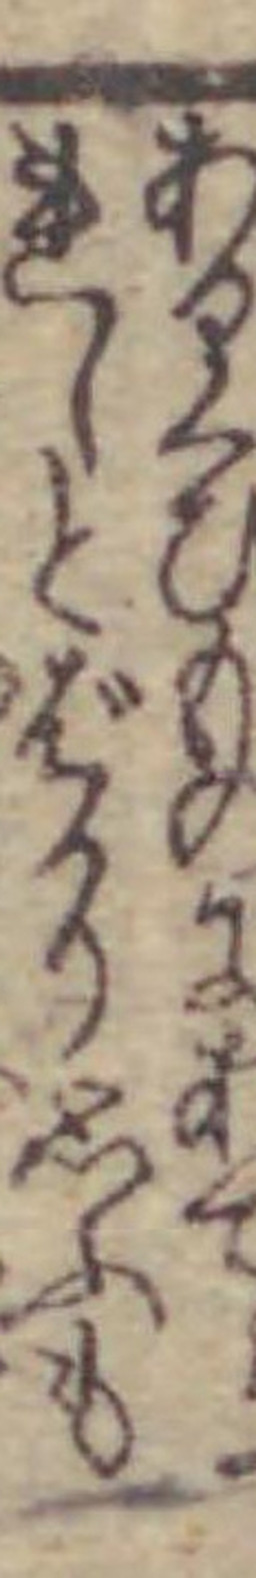れしとばかり思ふも
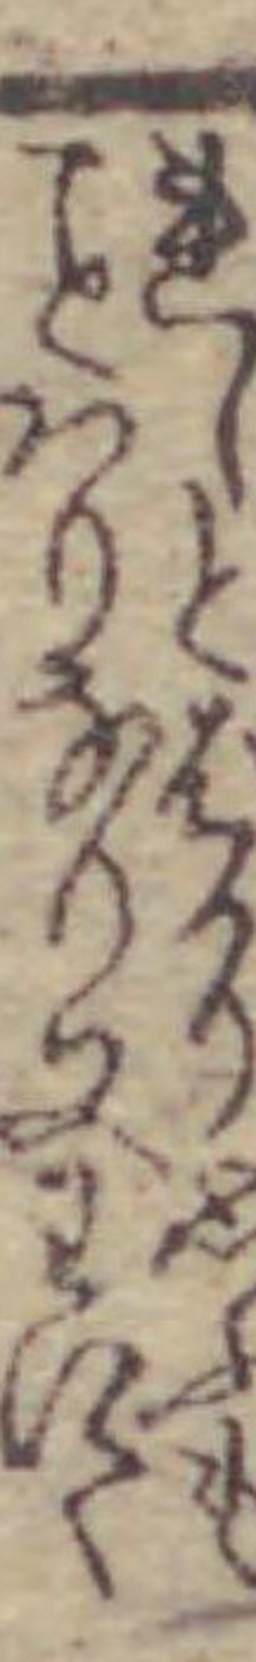ことはりなり又わにゝ
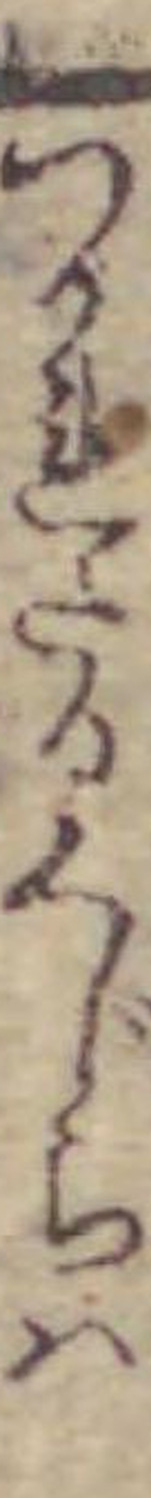つかれたるくじらは
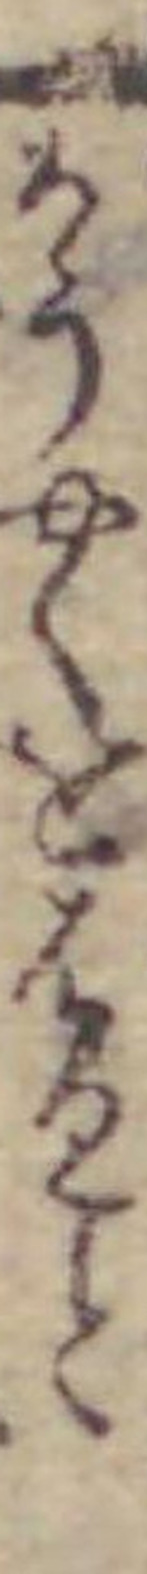かうやくをはると
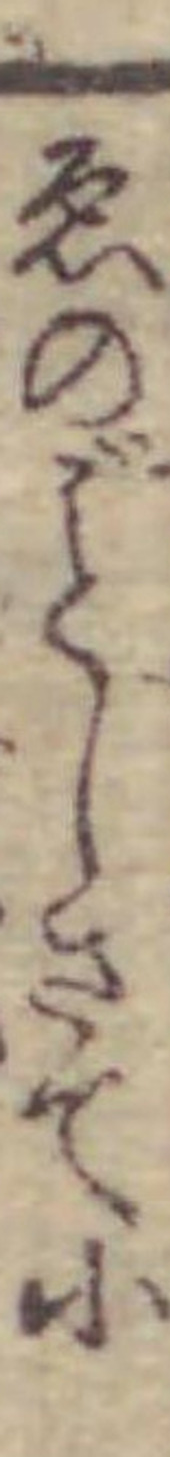ゑのごとしさて小
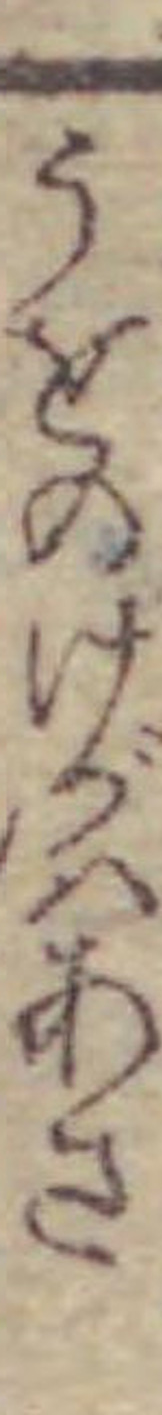うをのけがはあさ
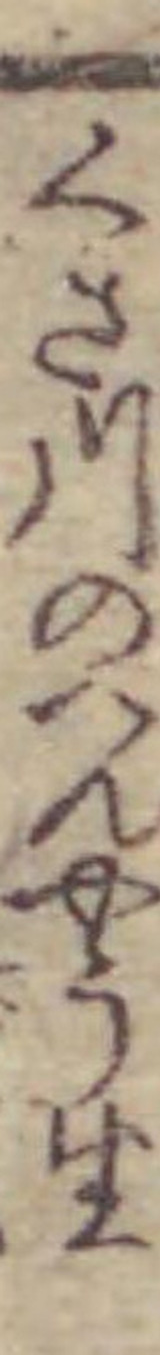くさ川のへんやう生
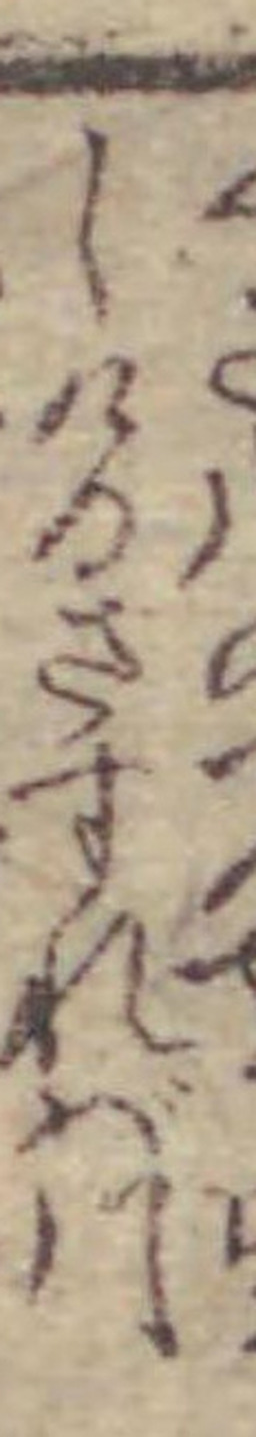しけるさすれば川
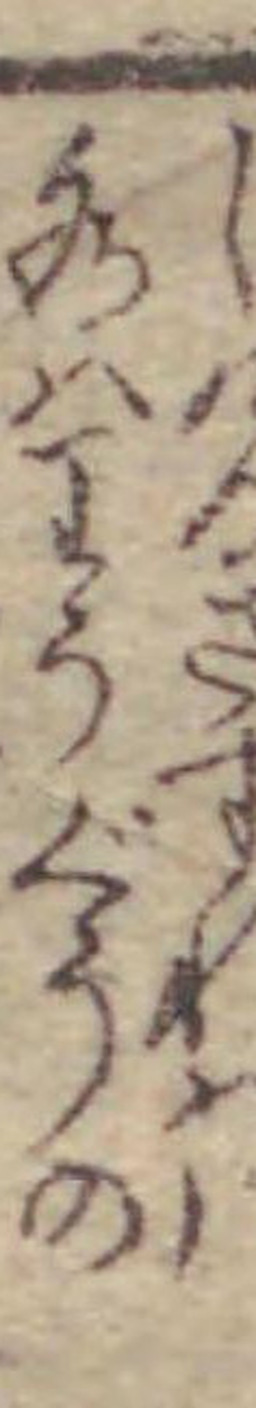水はりうぐうの
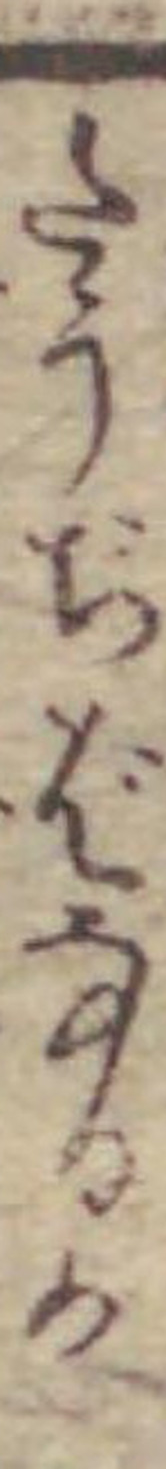たうぢばなるか
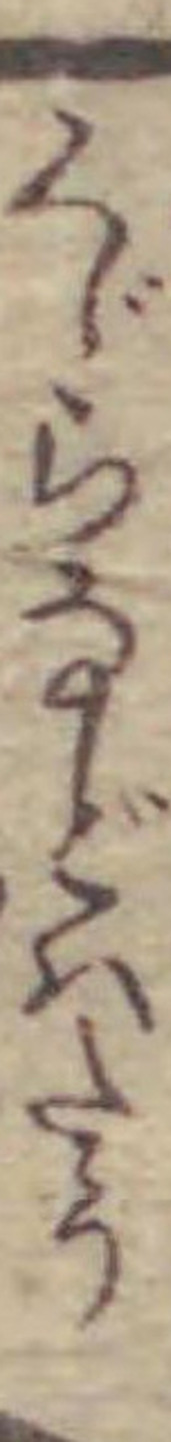くじらなどはたう
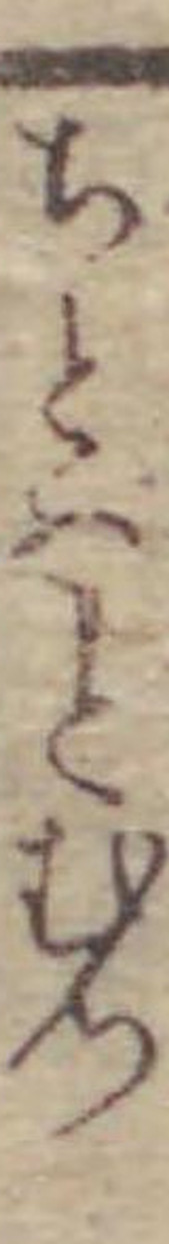ちとはとむつ
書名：即席耳学問 : 3巻
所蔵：国立国会図書館 National Diet Library, JAPAN
